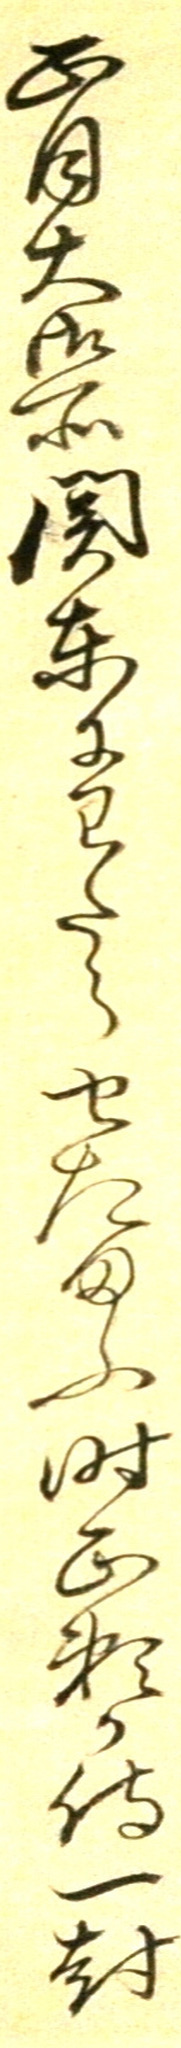正月大御所関東にわたらせたまふ時正頼か侍一封
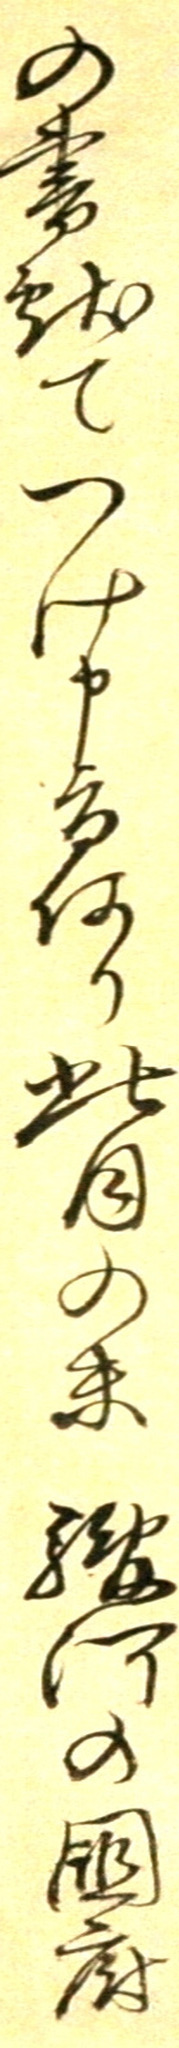の書献てつけ申旨あり此月の末駿河の国府
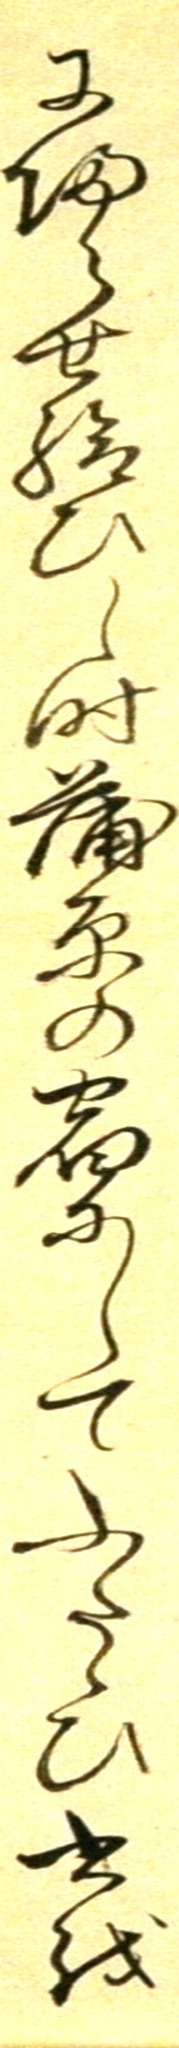に帰らせ給ひし時蒲原の宿にしてふたゝひ書を
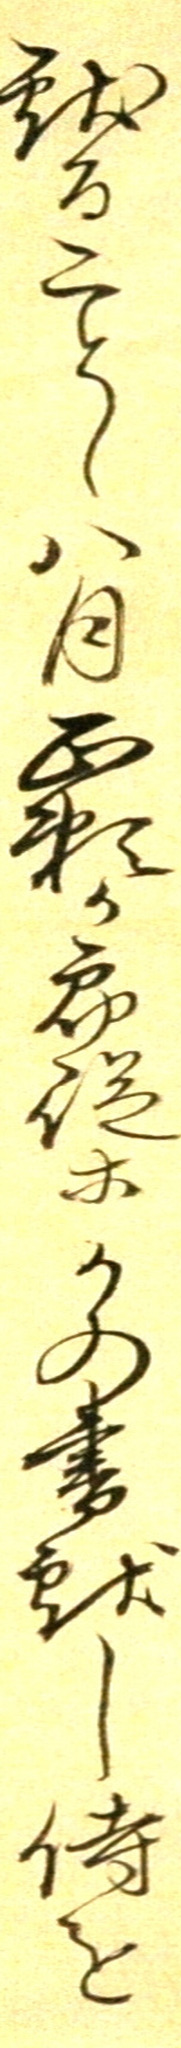献ることし八月正頼か郎従等かの書献し侍を
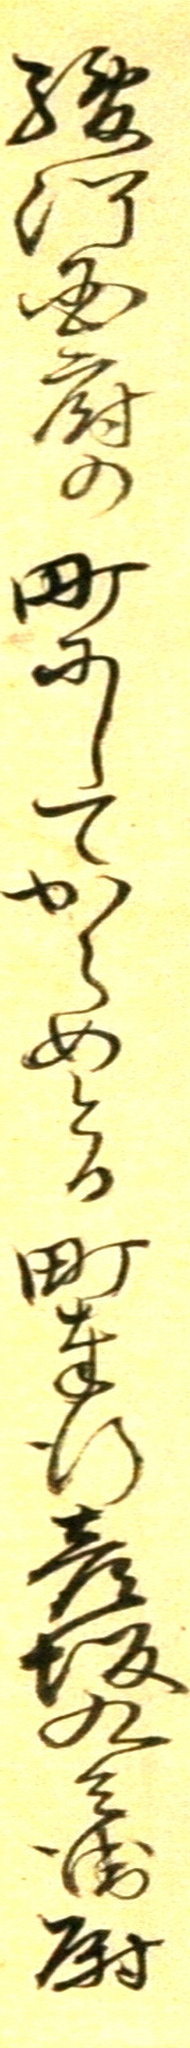駿河国府の町にしてからめとる町奉行彦坂九兵衛尉

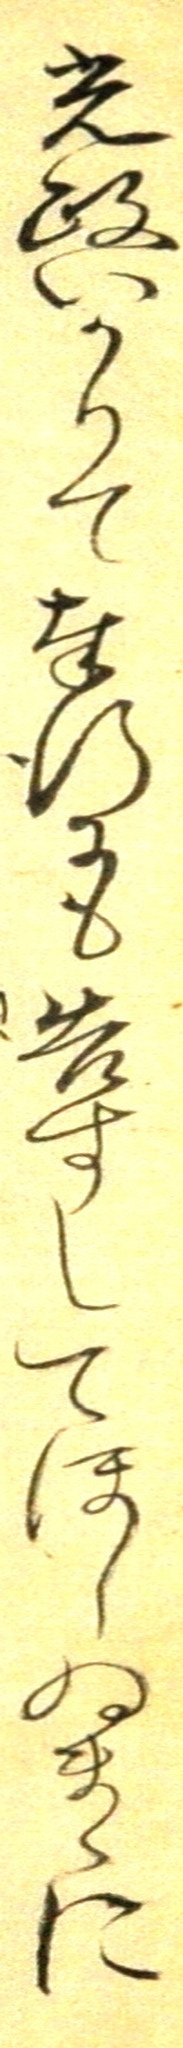光政いかりて奉行にも告すしてほしゐまゝに
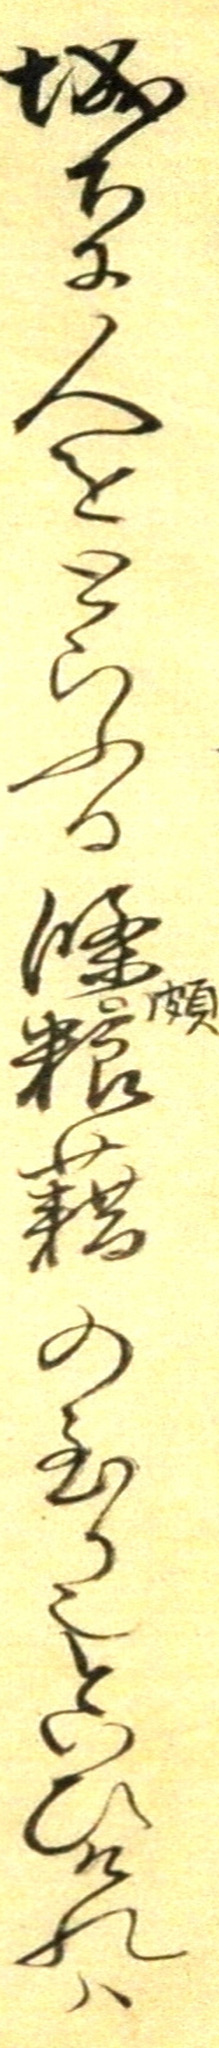城下に人をとらふる條粮藉の至り也といひけれは
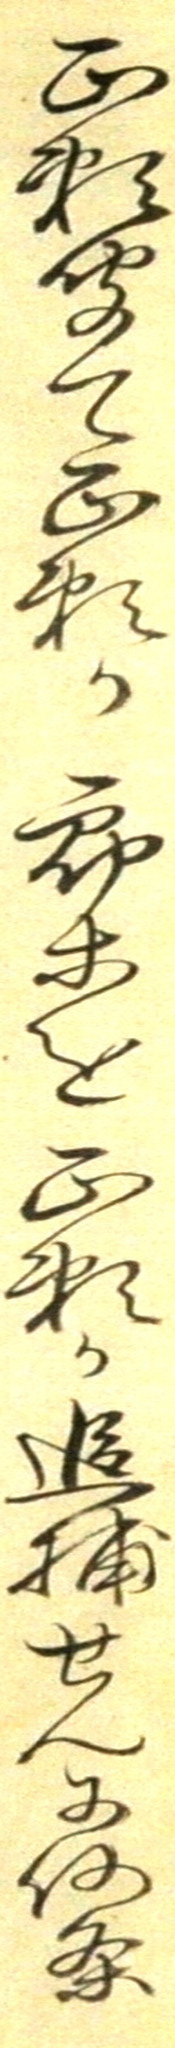正頼聞て正頼か郎等を正頼か追捕せんに何条
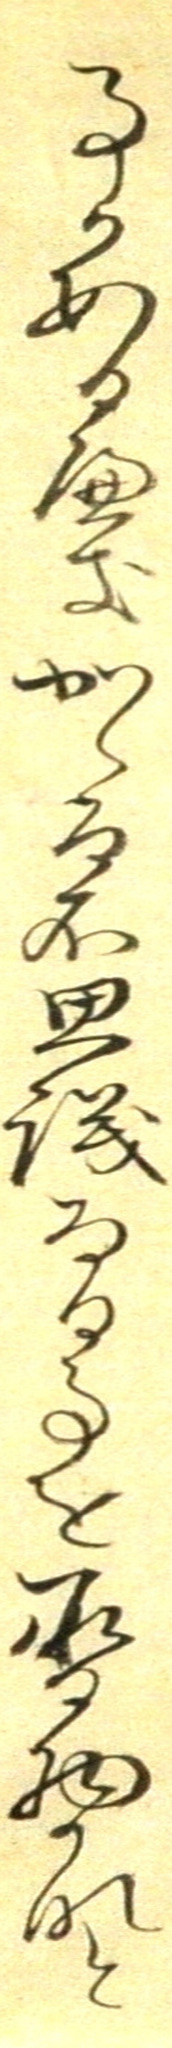事かあるへきかゝる不思議なる事を承る物かなと
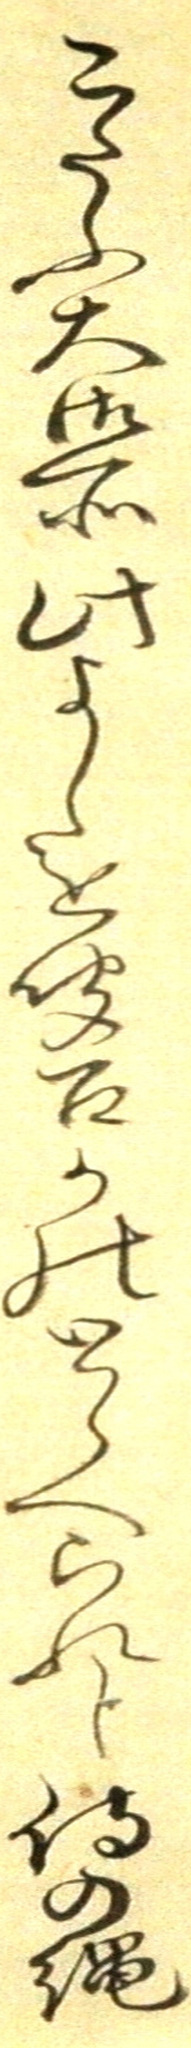こたふ大御所此よしを聞召かのとらへられし侍の縄
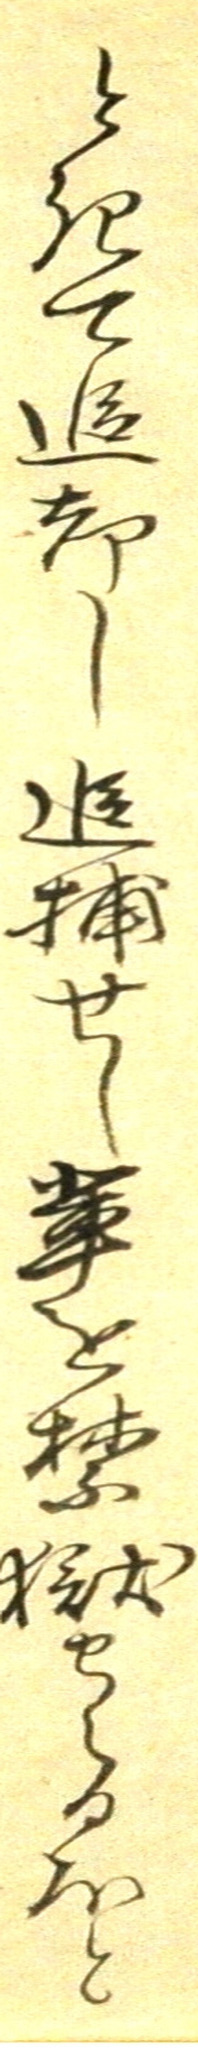ときて追却し追捕せし輩を禁獄せらるほと
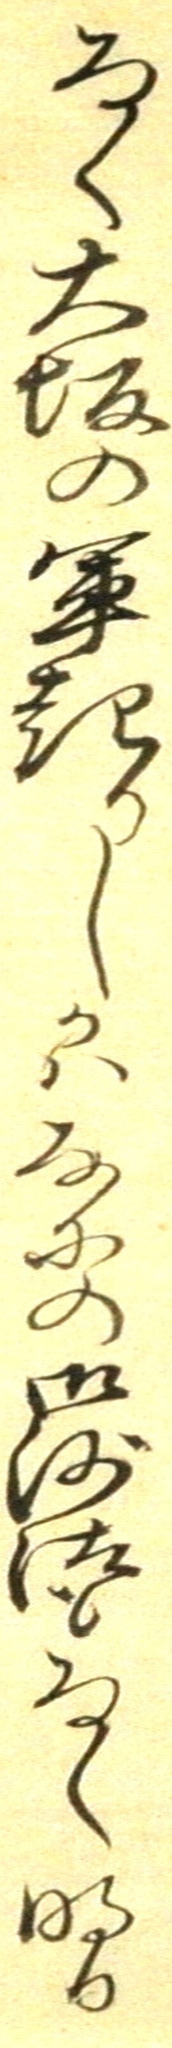なく大坂の軍起りしかはなにの御沙汰もなく明日
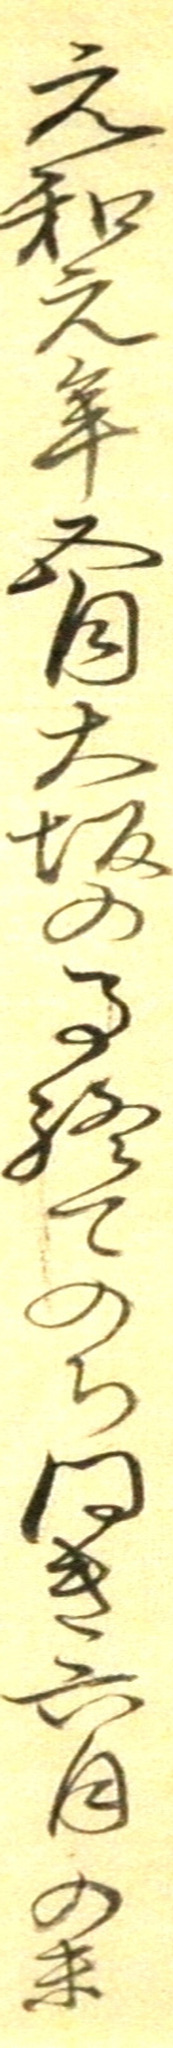元和元年五月大坂の事終てのち同き六月の末
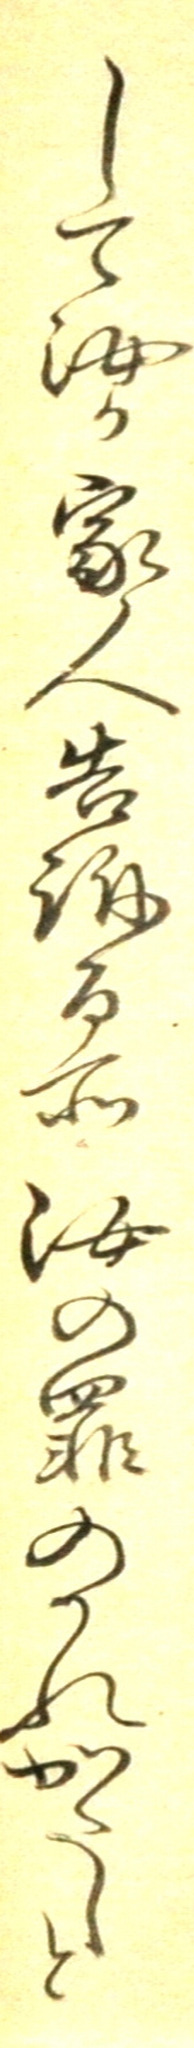して汝か家人告訴る所汝の罪のかれかたしと
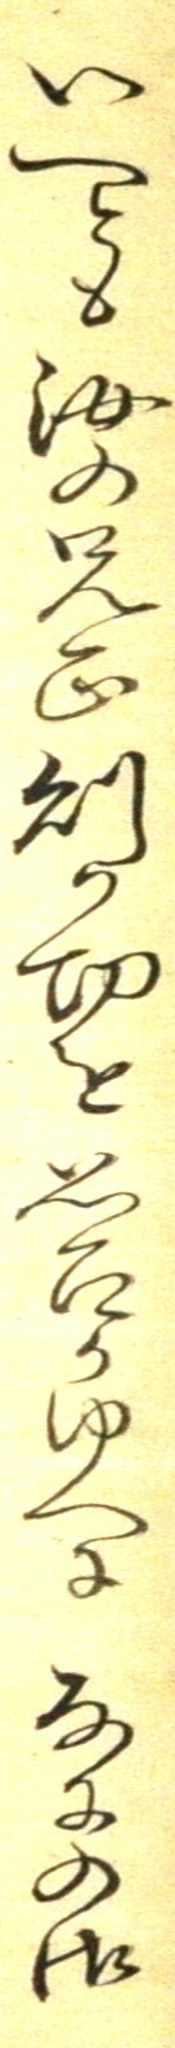いへとも汝の兄正則か功を思召かゆへになにの御
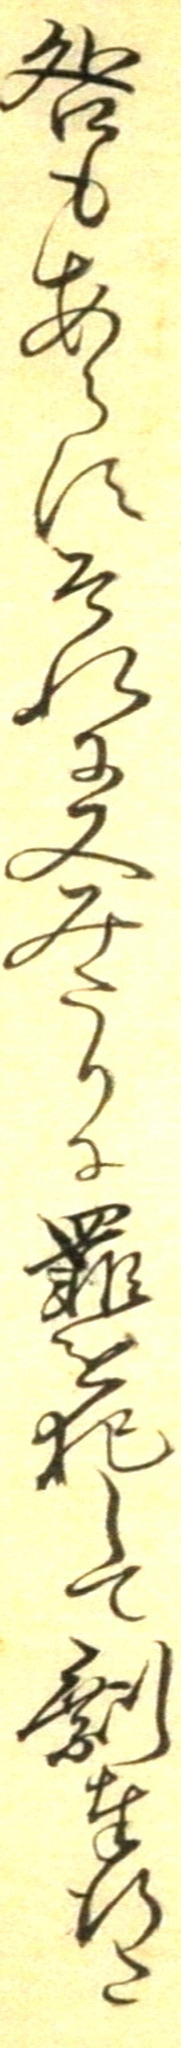咎もあらすそれに又みたりに罪を犯して剰奉行た
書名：藩翰譜（十二・上）
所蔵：伊那市立高遠町図書館・合同会社AMANE
